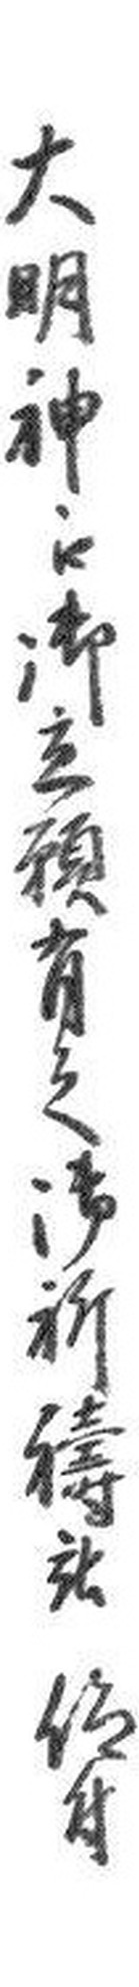大明神江御立願有之御祈祷被仰付
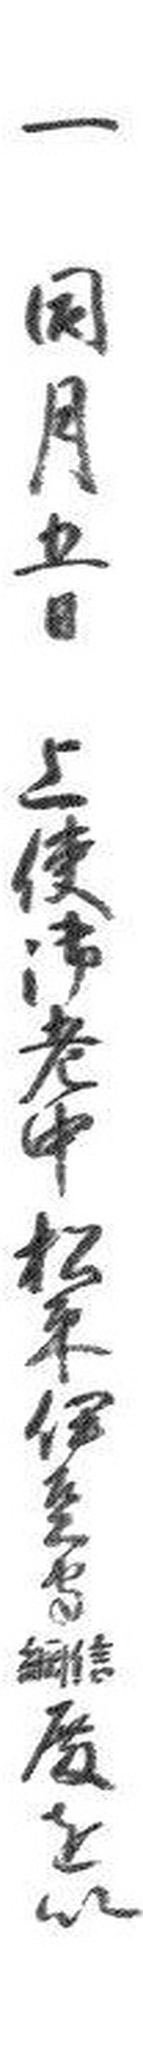一同月五日上使御老中松平伊豆守信綱殿を以
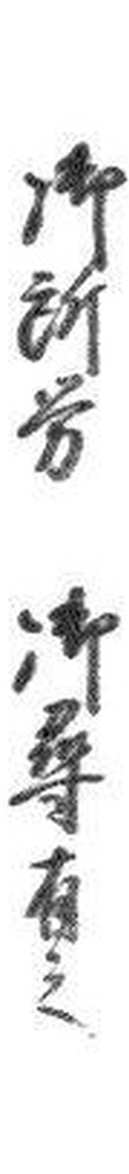御所労御尋有之
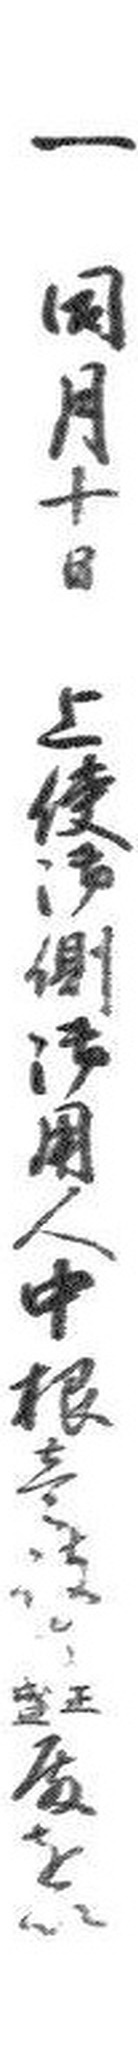一同月十日上使御側御用人中根壱岐守正盛殿を以
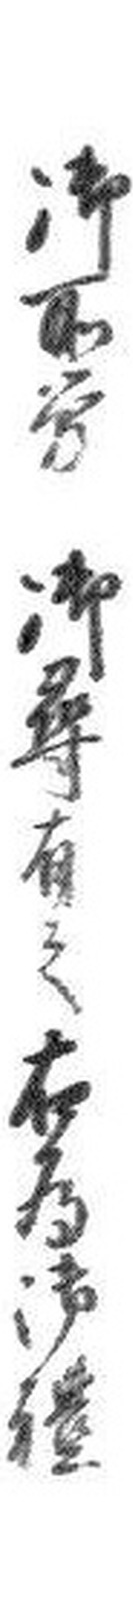御所労御尋有之右為御礼
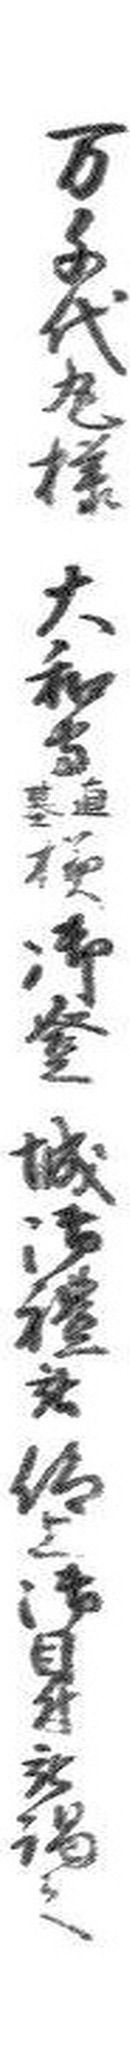万千代丸様大和守直基様御登城御礼被仰上御目付被謁之
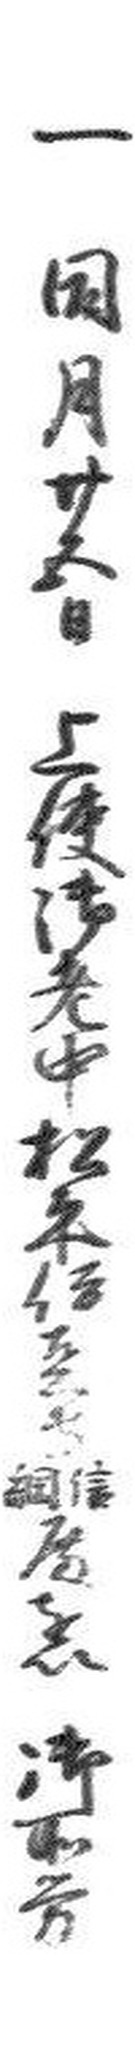一同月廿五日上使御老中松平伊豆守信綱殿を以御所労
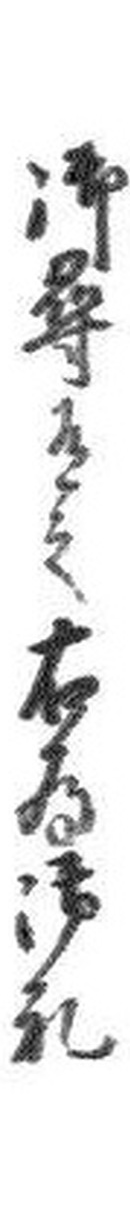御尋有之右為御礼
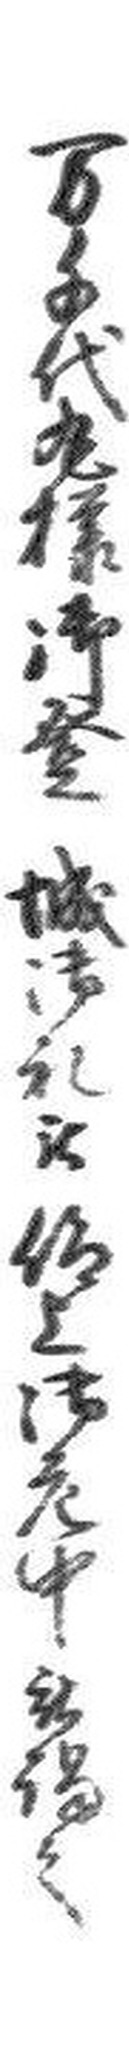万千代丸様御登城御礼被仰上御老中被謁之
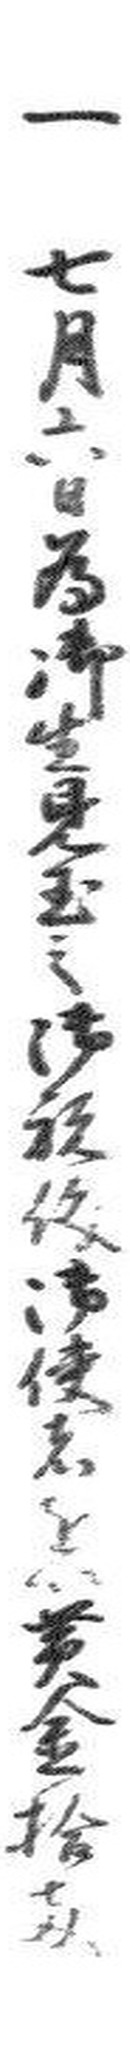一七月六日為御生見玉之御祝儀御使者を以黄金拾両
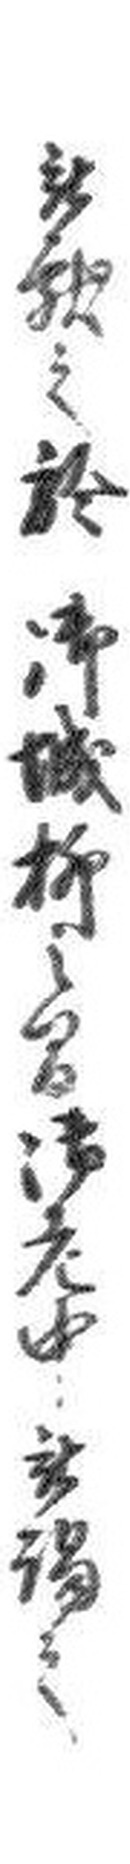被献之於御城柳之間御老中被謁之

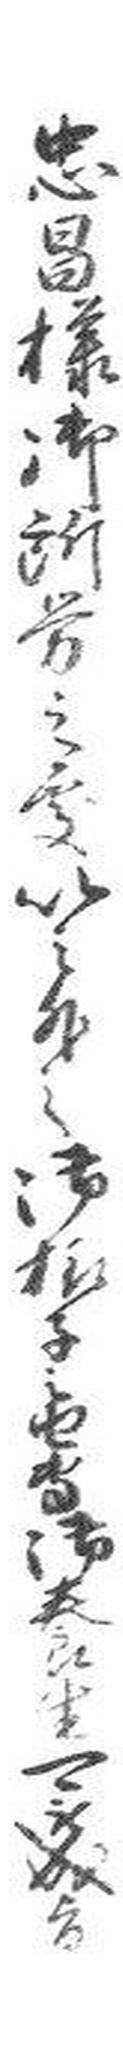忠昌様御所労之処以之外之御様子之由専御養生可被成旨
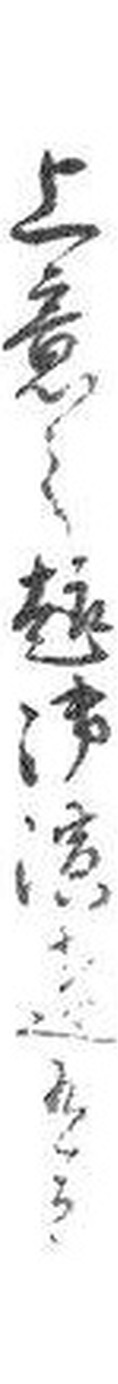上意之趣御演達有之
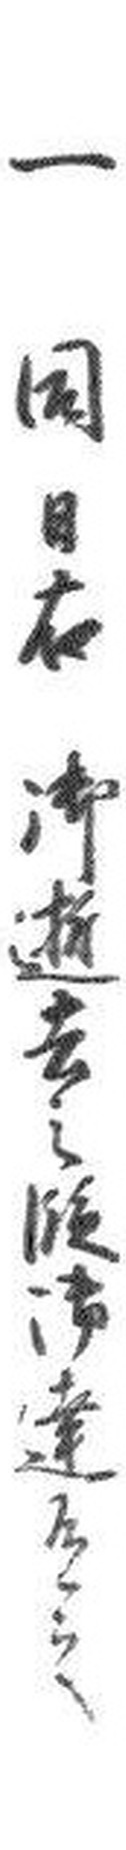一同日右御逝去之段御達有之
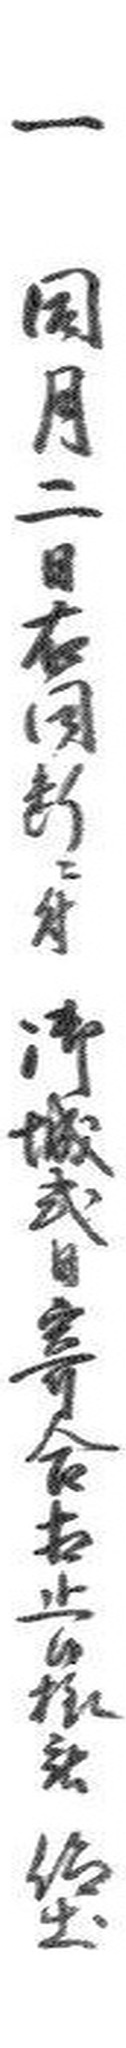一同月二日右同断ニ付御城式日寄合相止候様被仰出
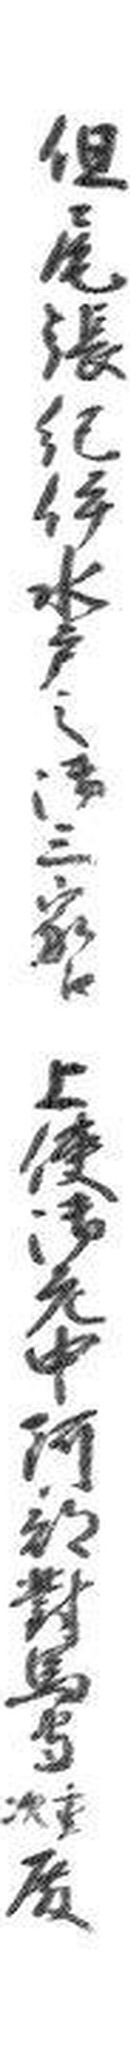但尾張紀伊水戸之御三家江上使御老中阿部対馬守重次殿
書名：家譜 四 忠昌公 従寛永七年到正保四年
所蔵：福井県文書館 Fukui Prefectural Archives
